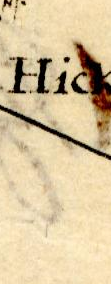Hick
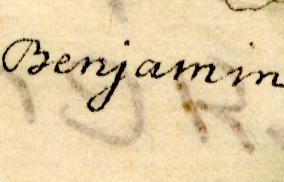Benjamin
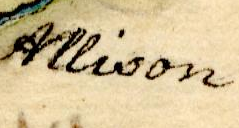Allison
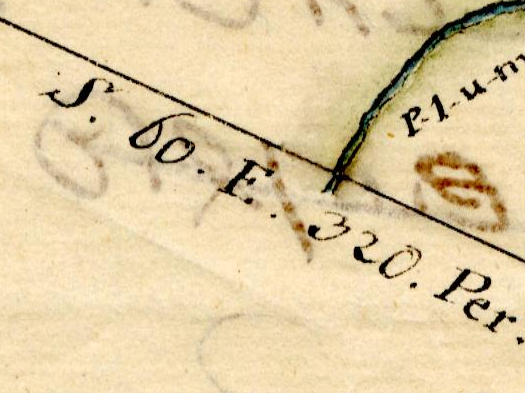S. 60. F. 320. Per.
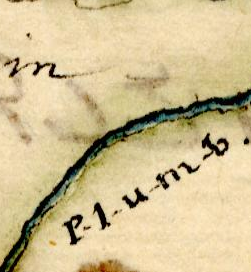P-l-u-m-b
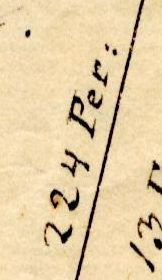224 Per:
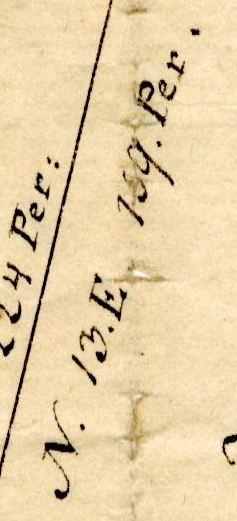N. 13.E. 159. Per.
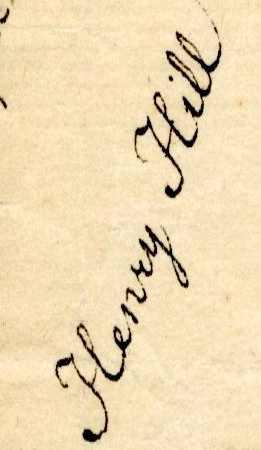Henry Hill
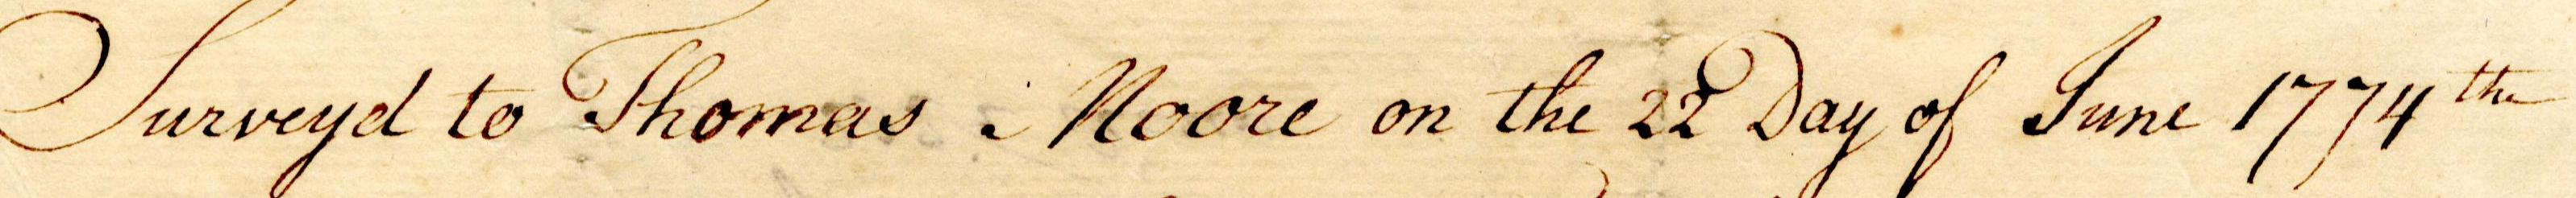Surveyd to Thomas Moore on the 22 Day of June 1774^th
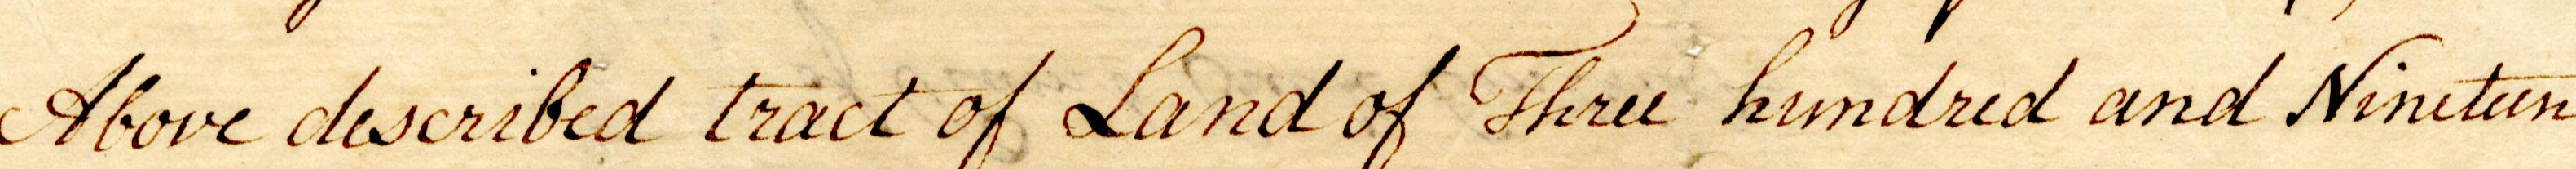Above described tract of Land of Three hundred and Nineteen
